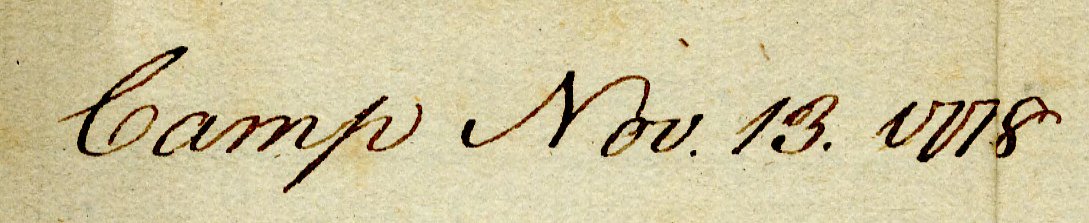Camp Nov. 13. 1778
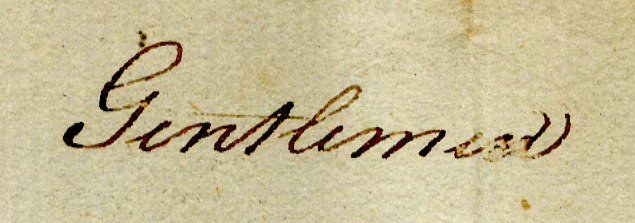Gentlemen
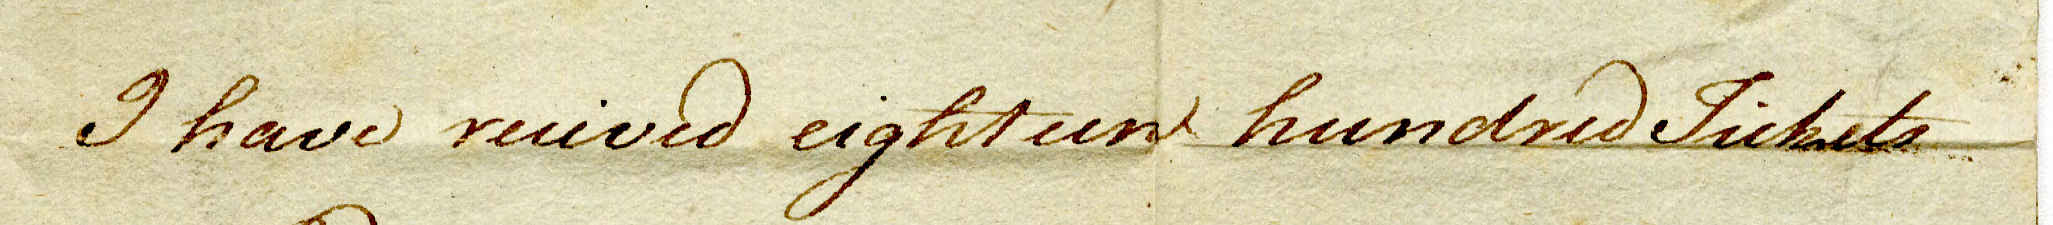I have recived eighteen hundred Tickets
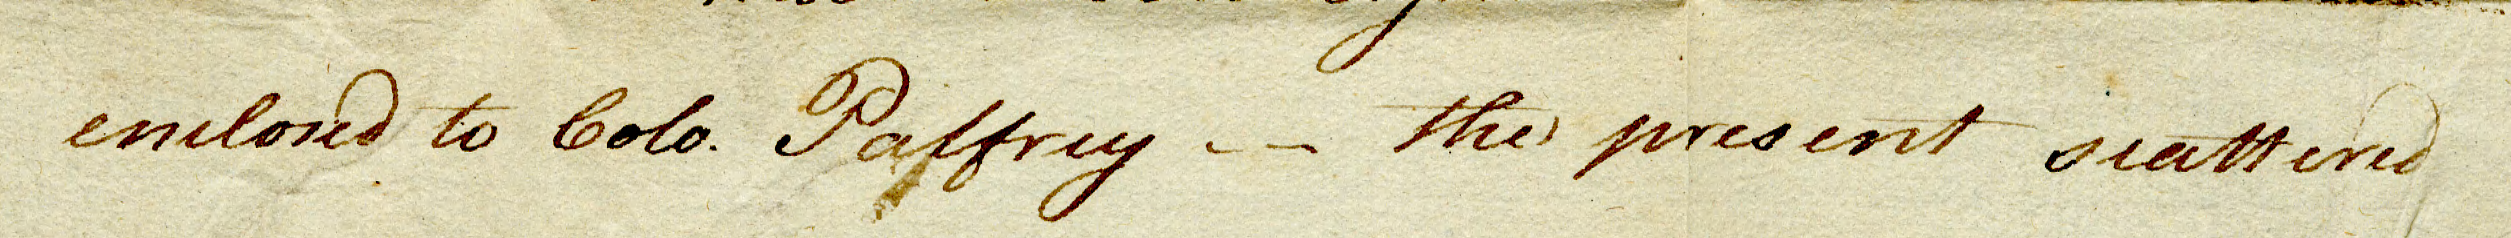enclosed to Colo. Palfrey - the present scattered
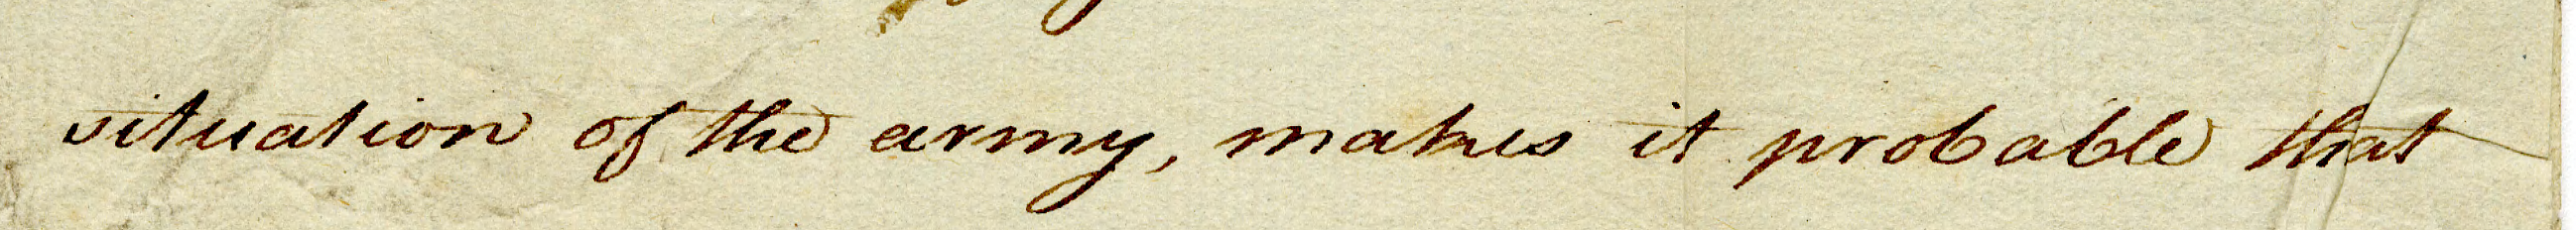situation of the army, makes it probable that
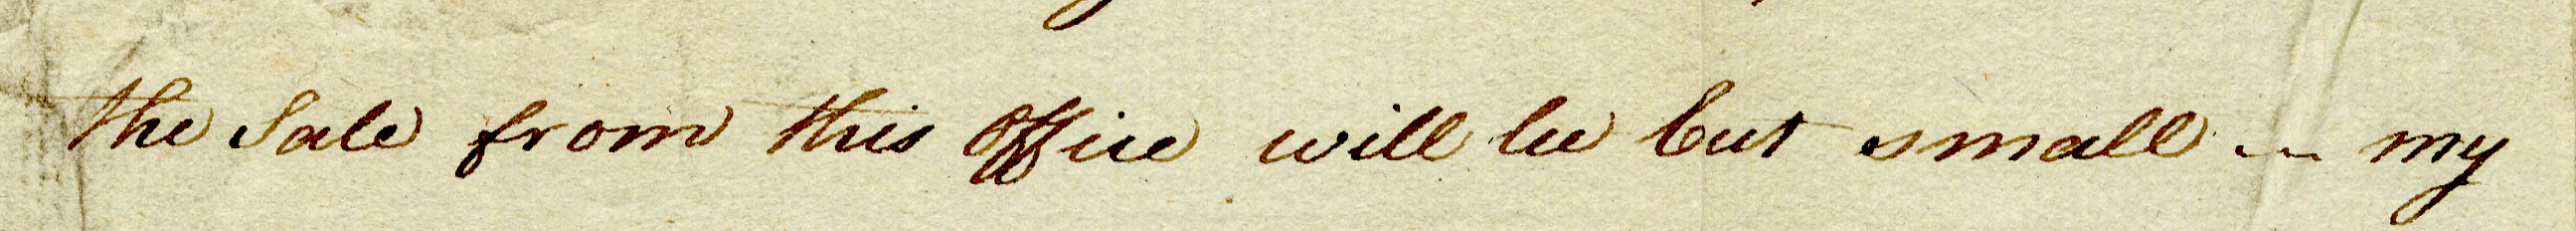the sale from this office will be but small- my
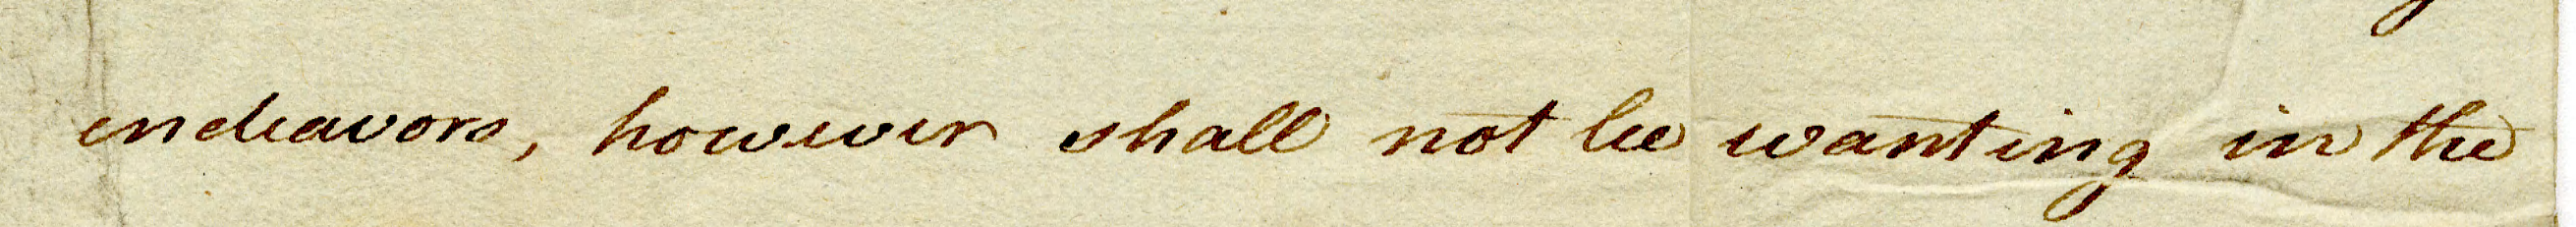endeavors, however shall not be wanting in the
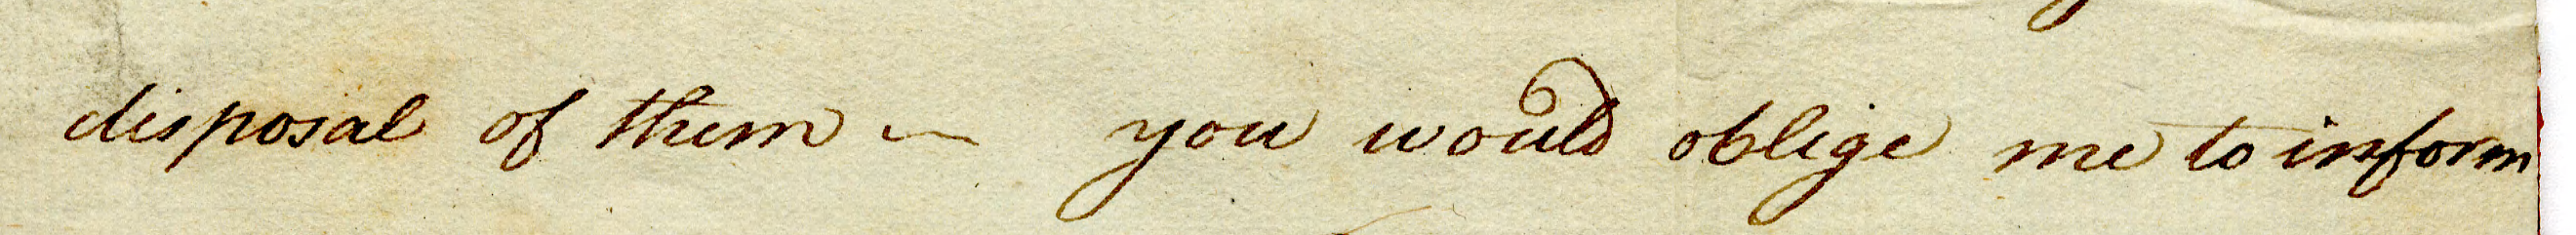disposal of them- you would oblige me to inform
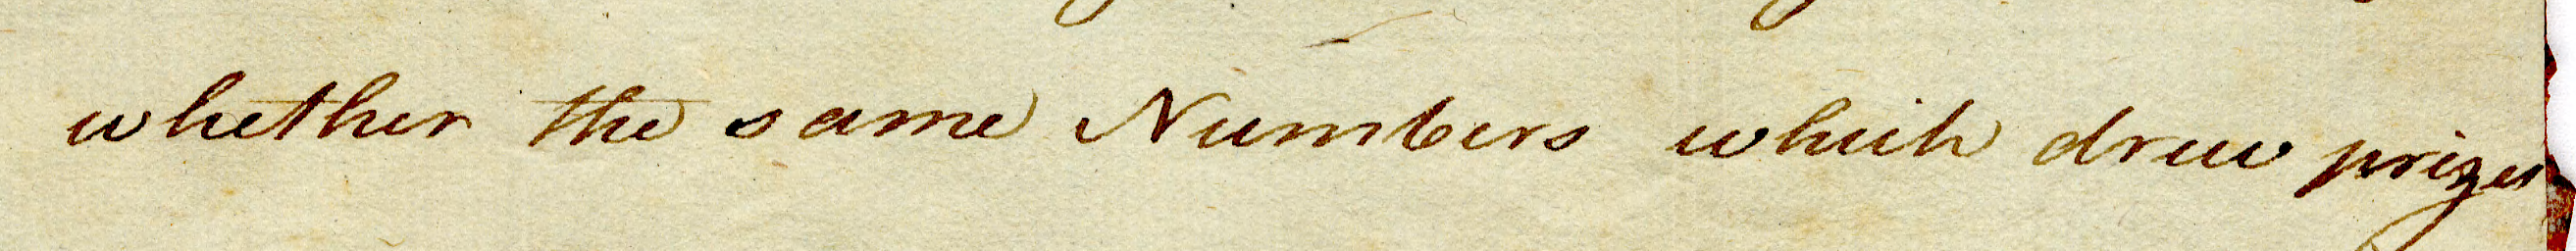whether the same Numbers which drew prizes
